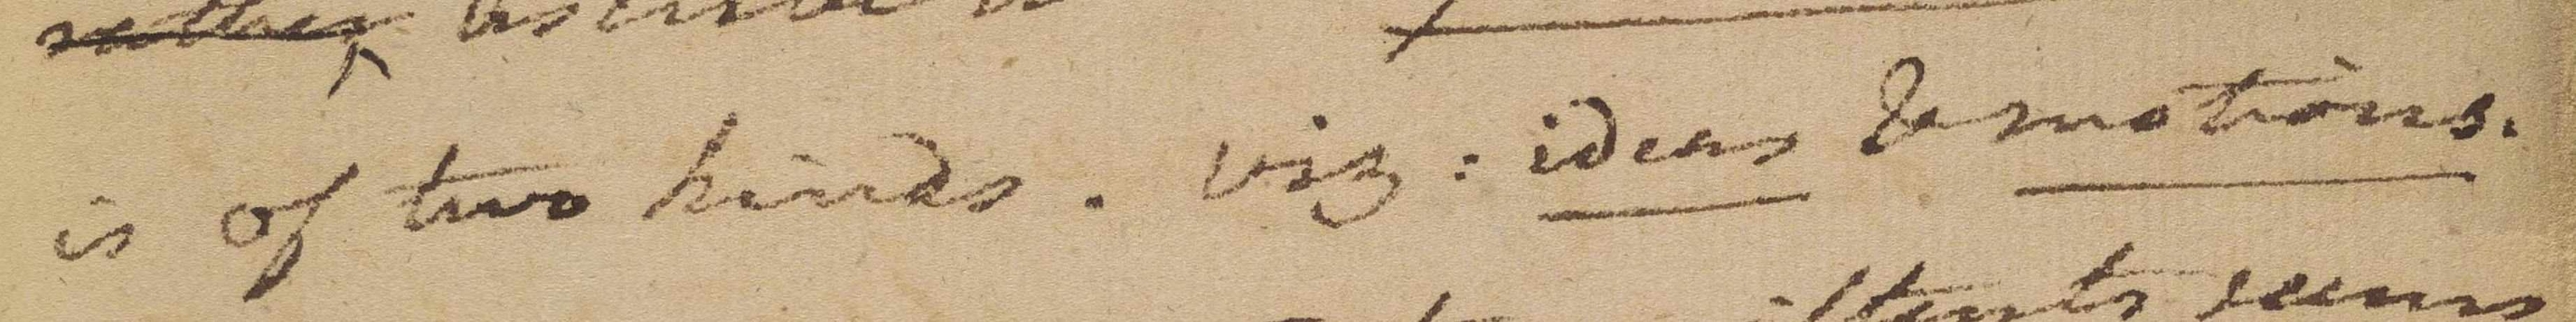is of two kinds, viz. ideas & motions.
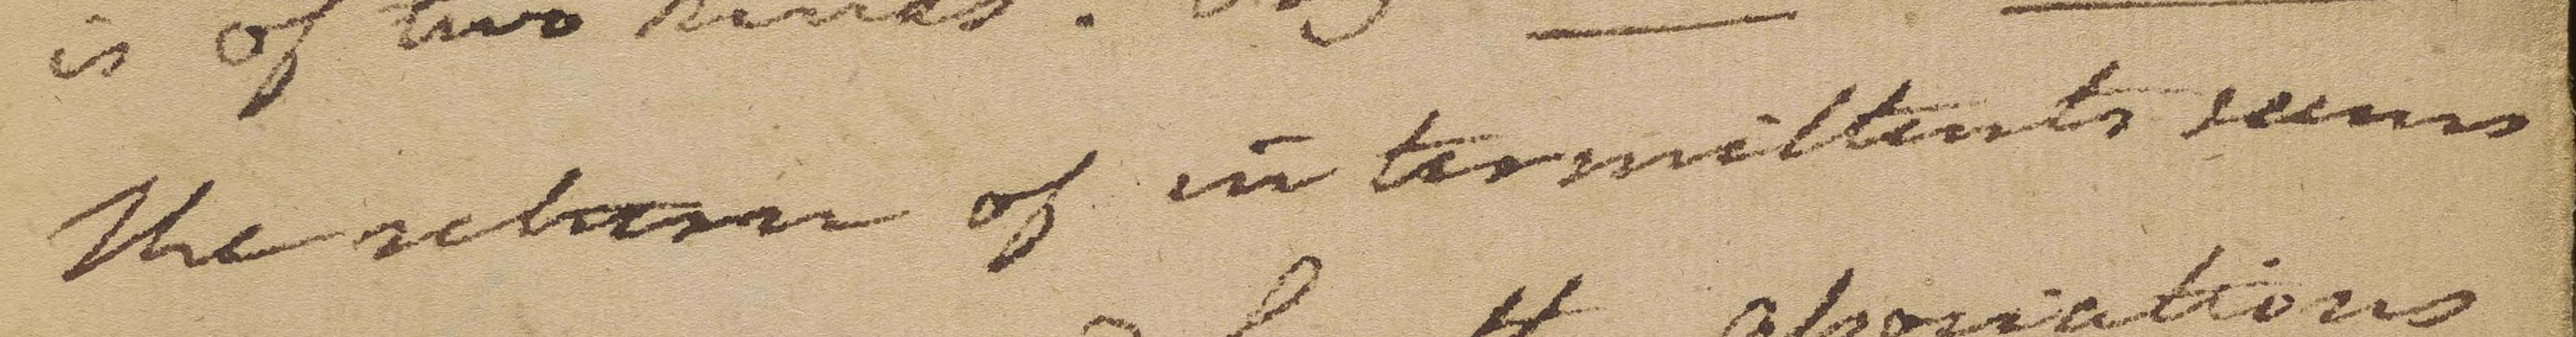The turn of intermittents seems
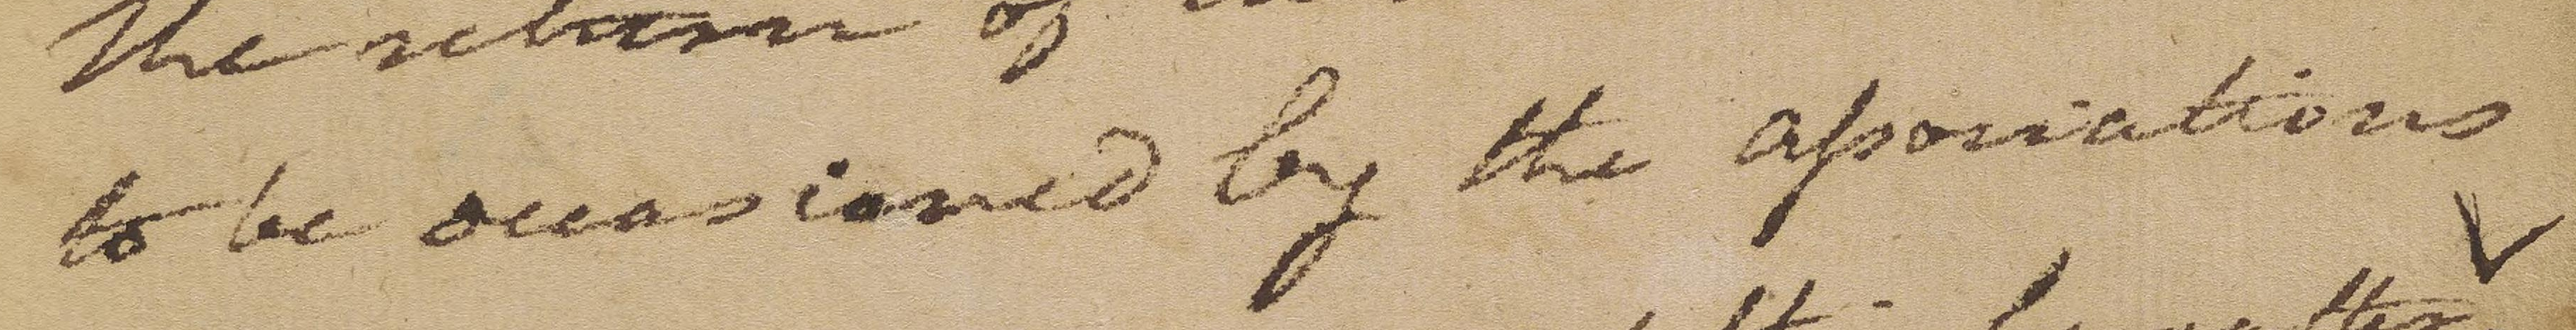to be occasioned by the associations
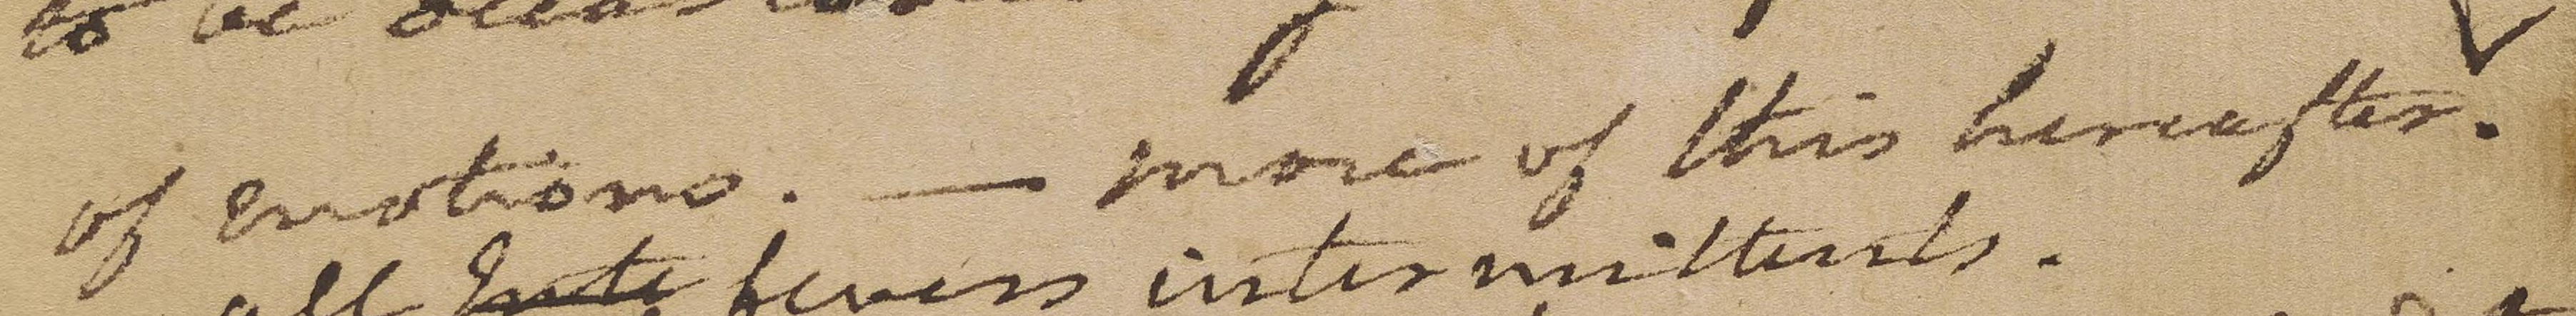of emotions.- More of this hereafter. V
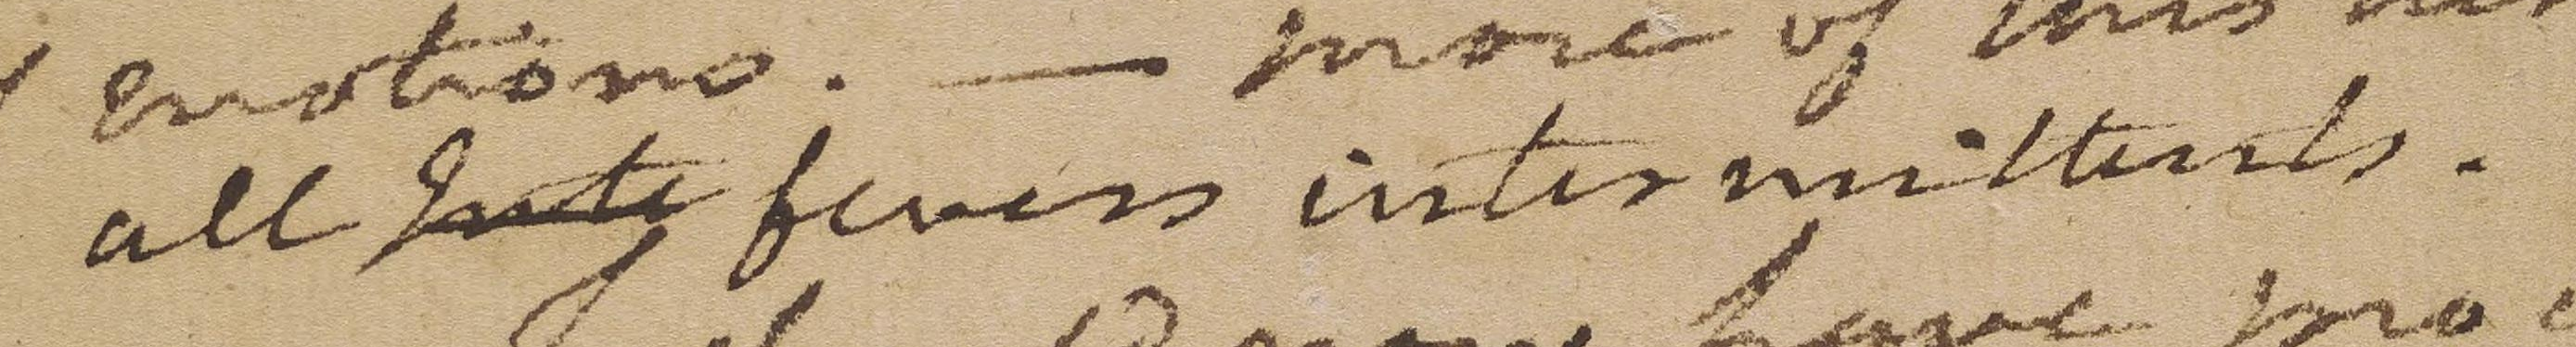all [Inte] fevers intermittents.
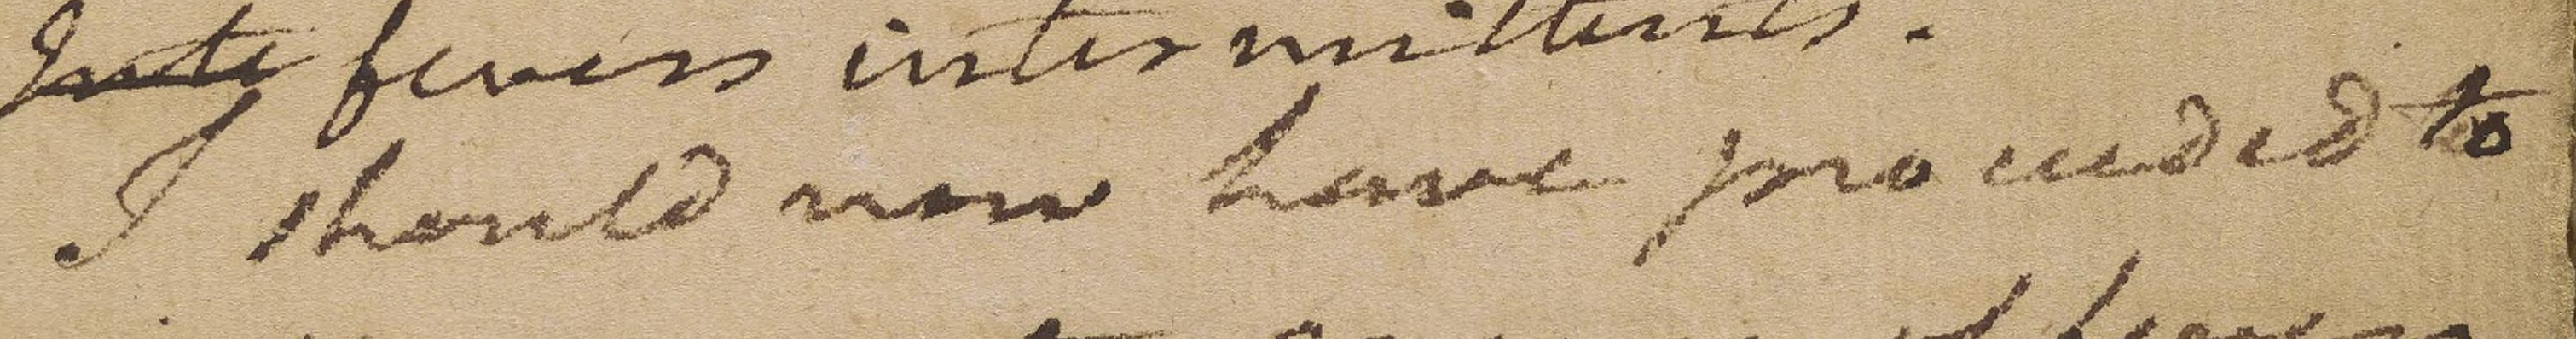I should now have proceeded to
